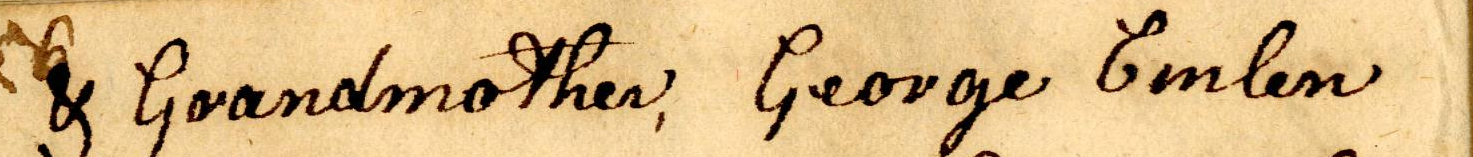& Grandmother, George Emlen
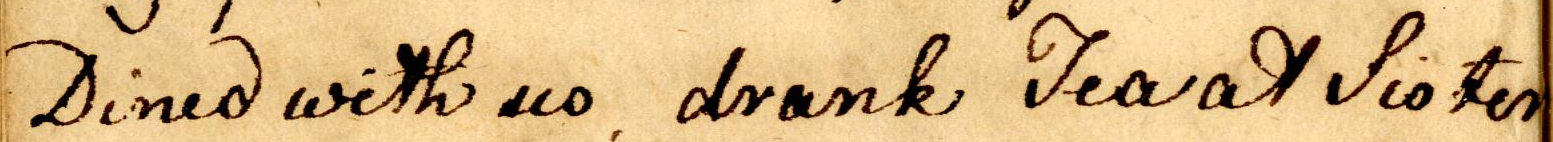Dined with us, drank Tea at Sister
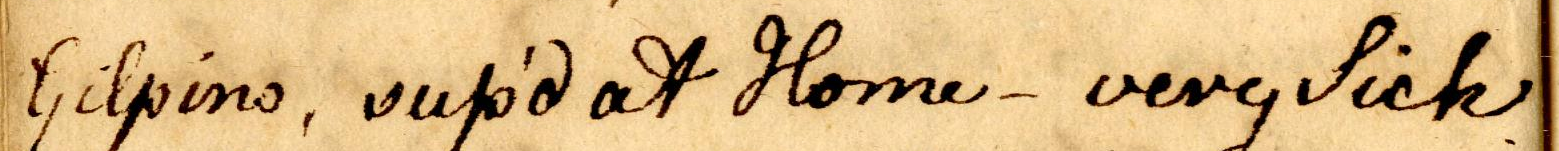Gilpins, sup'd at Home- very Sick
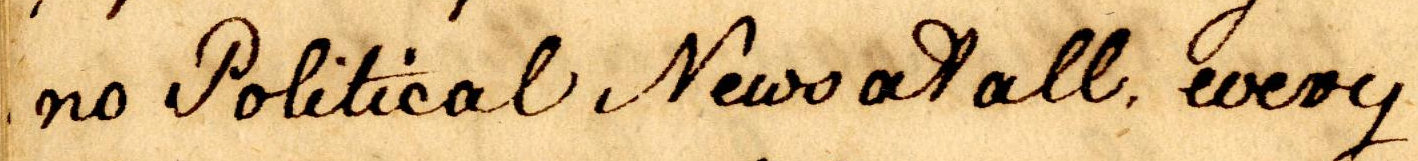no Political News at all, every
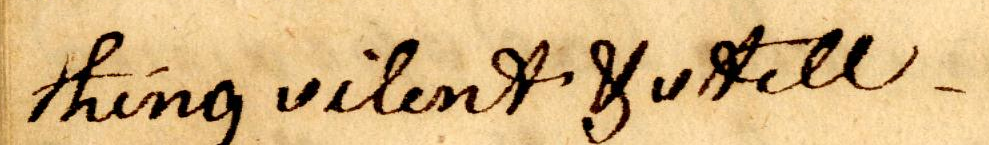thing silent & still-
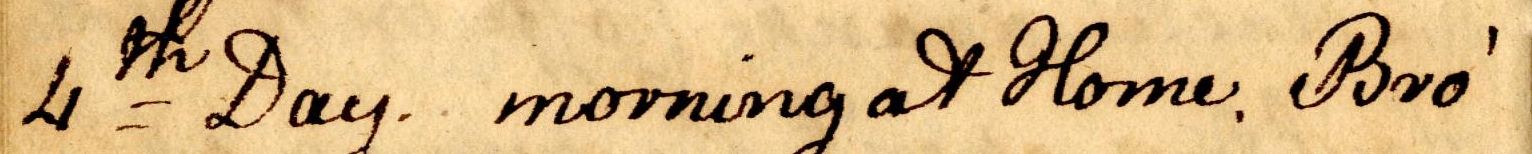4^th Day. morning at Home. Bro'
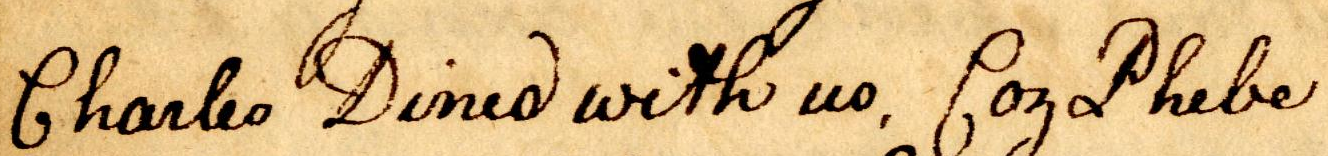Charles Dined with us, Coz Phebe
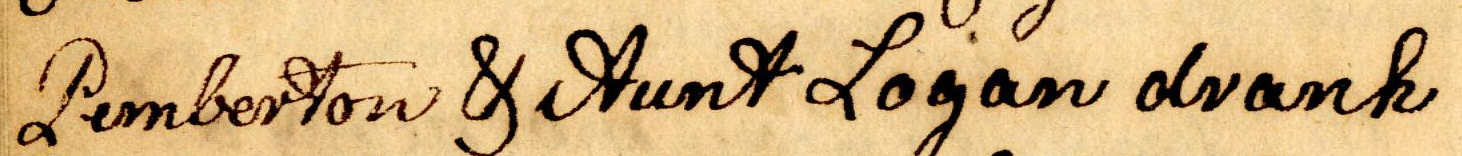Pemberton & Aunt Logan drank
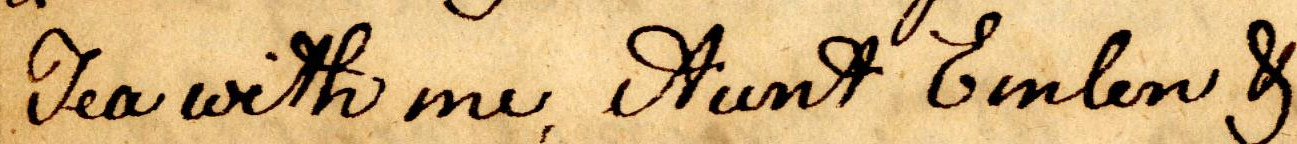Tea with me, Aunt Emlen &
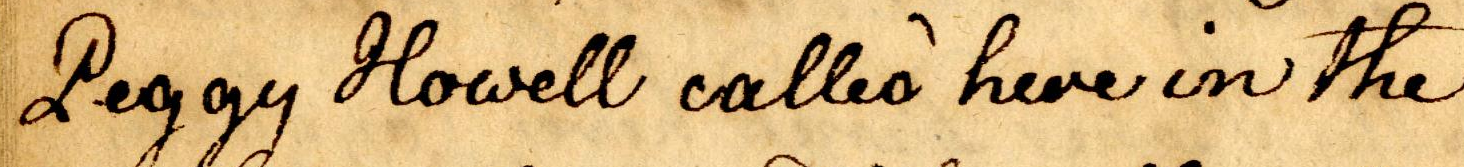Peggy Howell called here in the
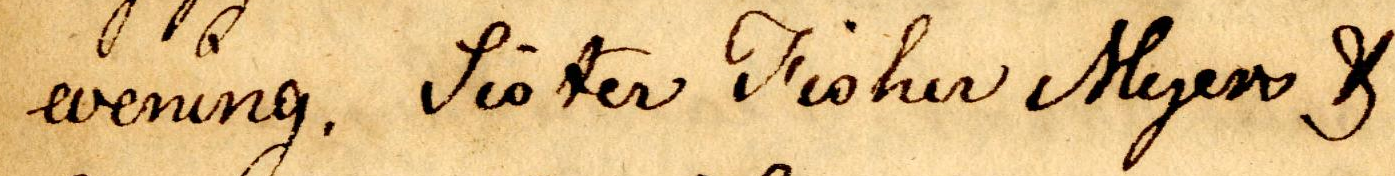evening. Sister Fisher Myers &
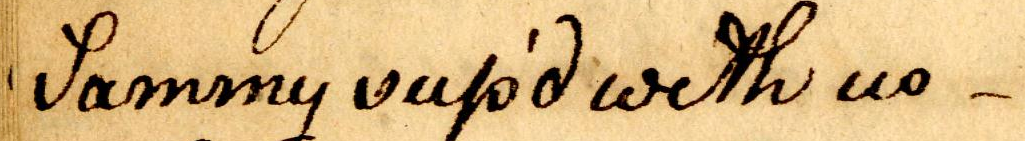Sammy sup'd with us-
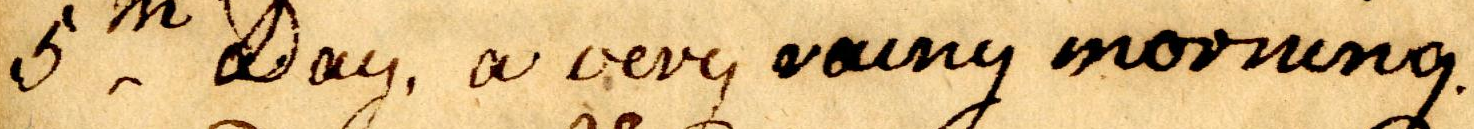5^th Day, a very rainy morning.
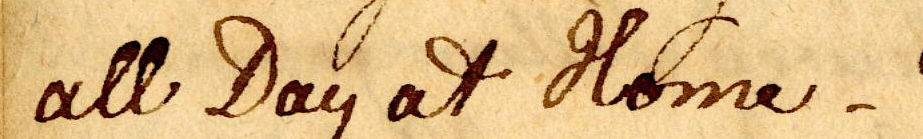all Day at Home-
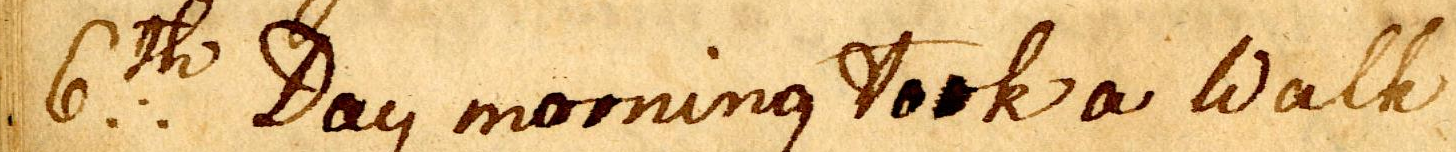6^th Day morning took a Walk
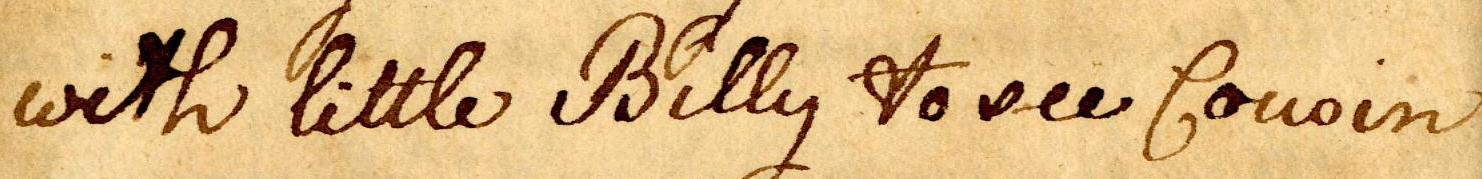with little Billy to see Cousin
